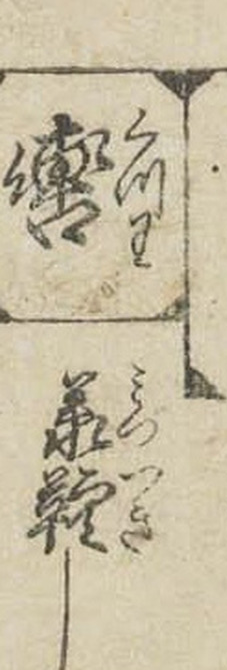轡承鞚
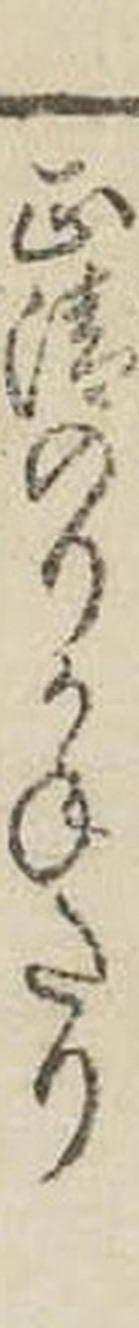正清のりかねたり手掛
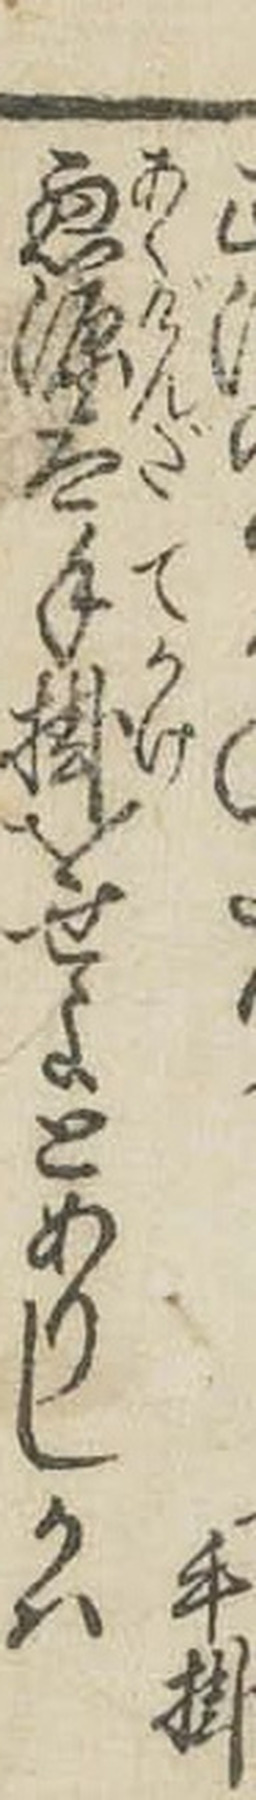悪源太手掛をせよとありしかは
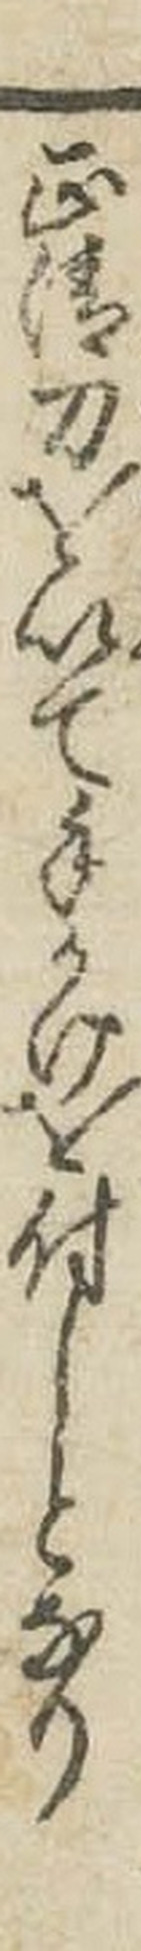正清刀を以て手かけを付しとなり
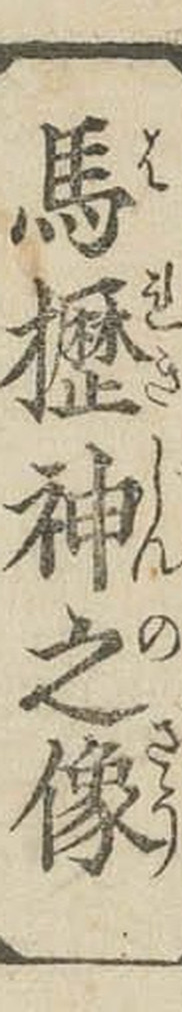馬櫪神之像
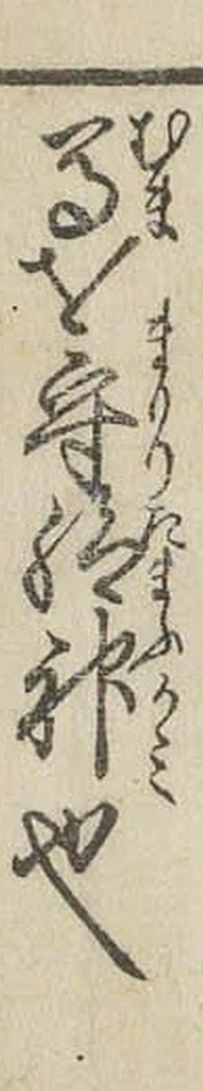馬を守給神也
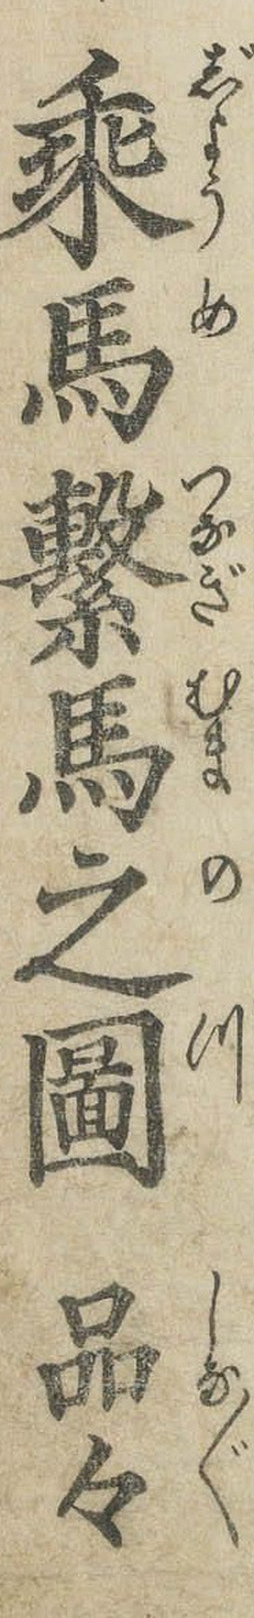乗馬繋馬之図品々

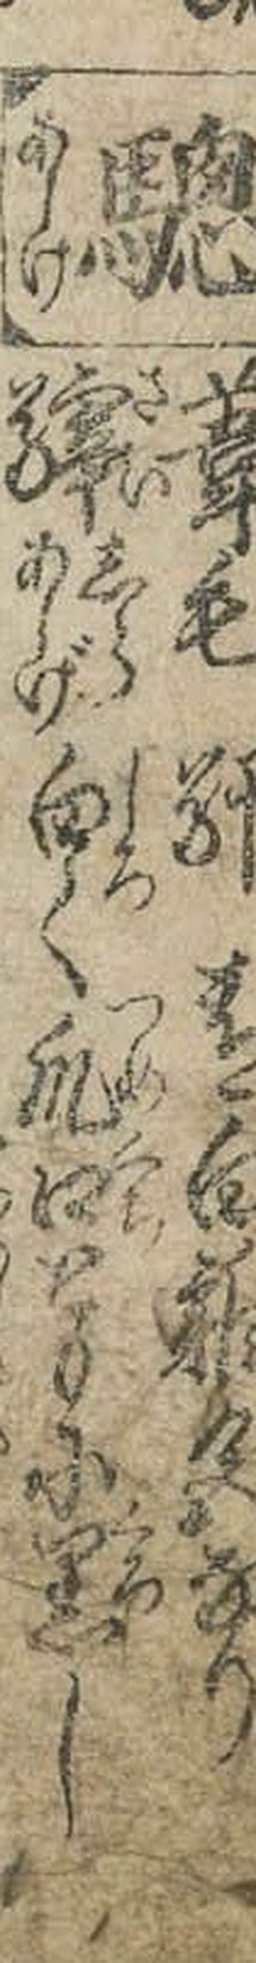䮨しらあしげ白く爪口ともに黒し
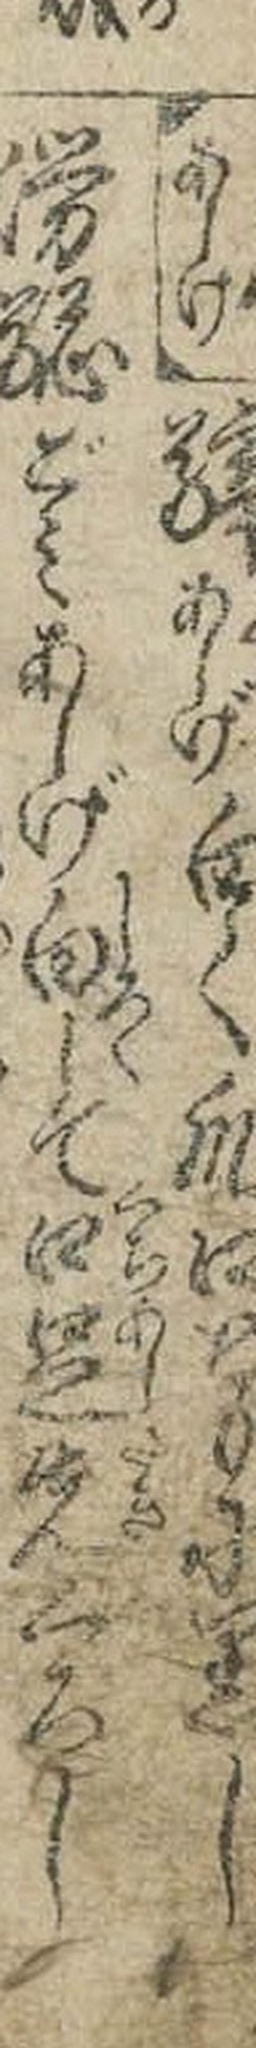澇驄ごまあしげ白して口足先くろし
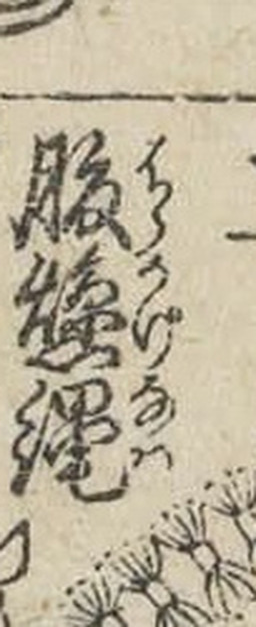腹懸縄
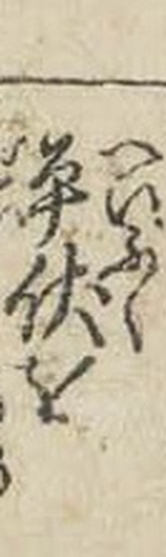平伏を
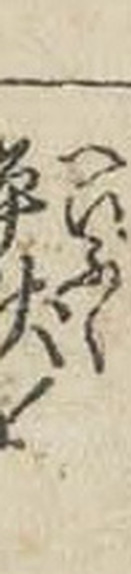平伏を
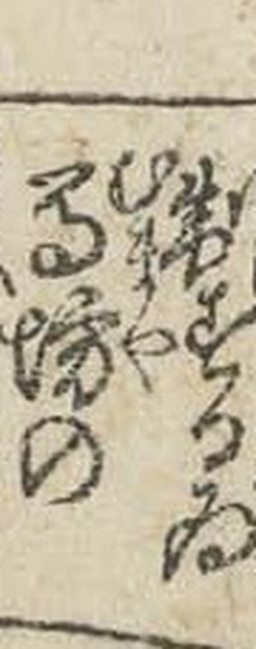馬坊の
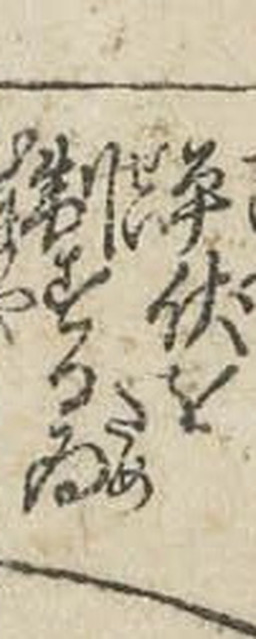制する為
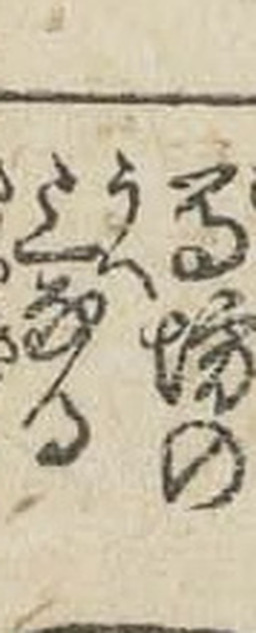上なる
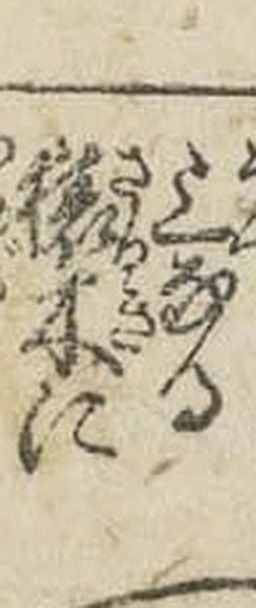猿木に
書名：絵本写宝袋 9巻 2之巻
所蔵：東京学芸大学教育コンテンツアーカイブ
